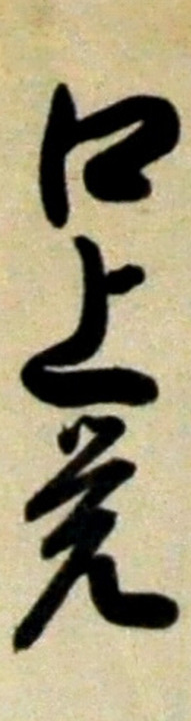口上覚
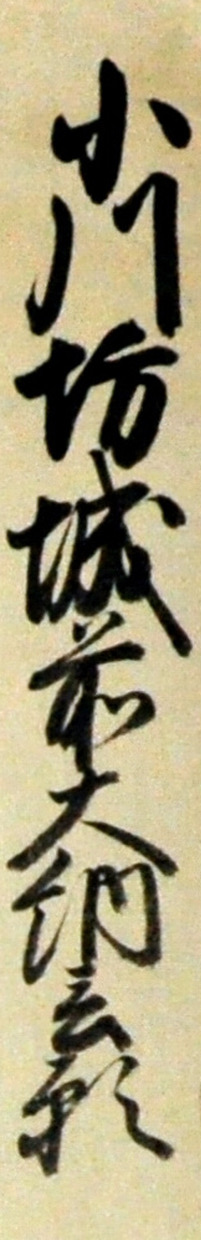小川坊城前大納言願
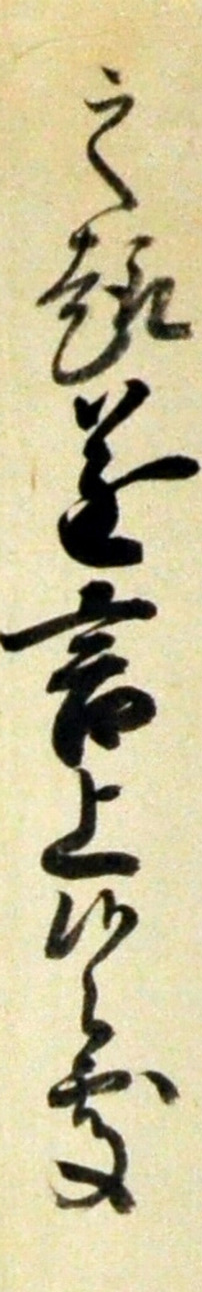之趣遂言上候之處
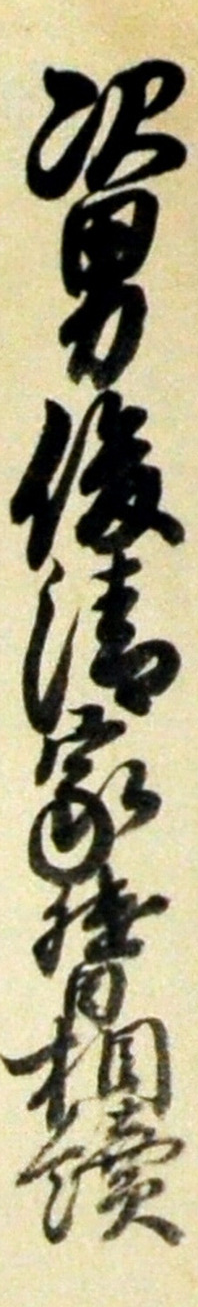次男俊清家督相続
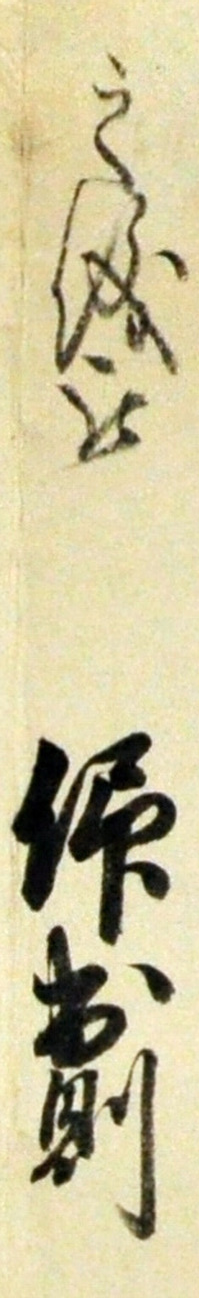之儀被仰出則
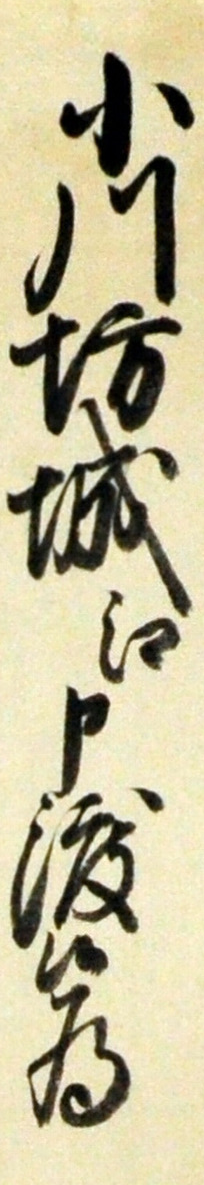小川坊城え申渡候為
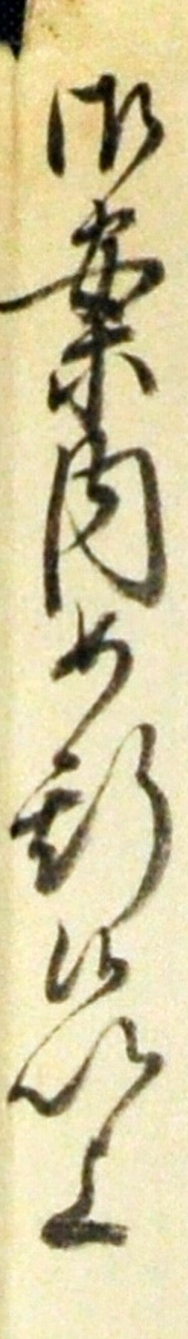御案内如斯候以上
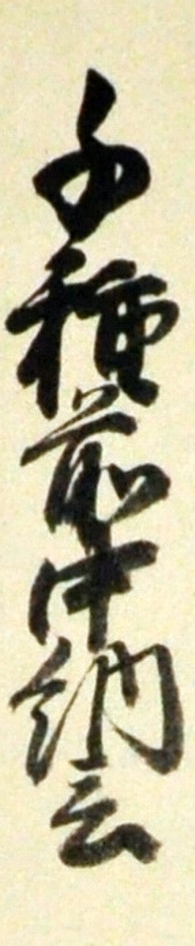千種前中納言
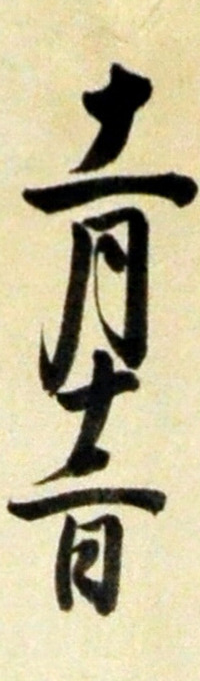十一月十二日
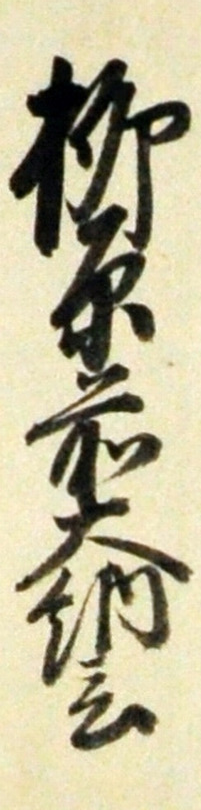柳原前大納言
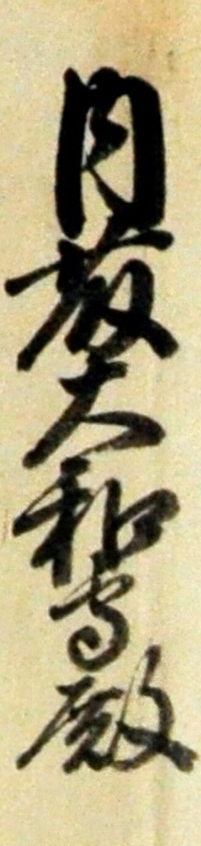内藤大和守殿
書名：口上覚
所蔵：伊那市立高遠町図書館・合同会社AMANE
